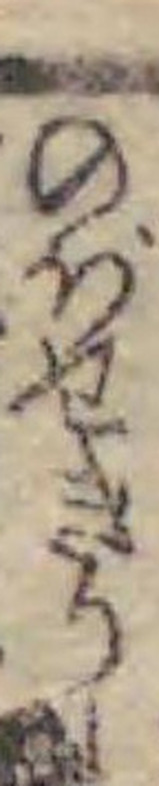のぼせきり
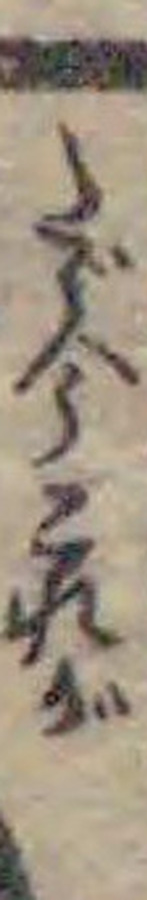たゞ今これが
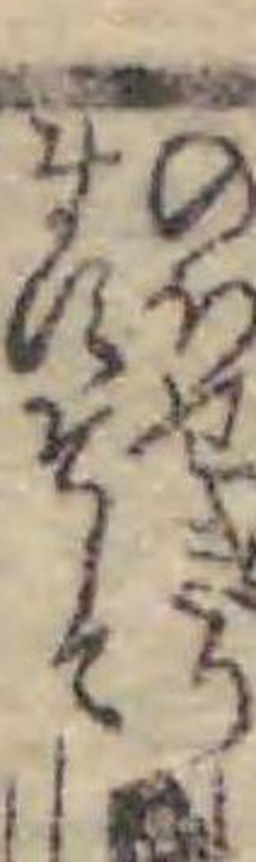ますそして
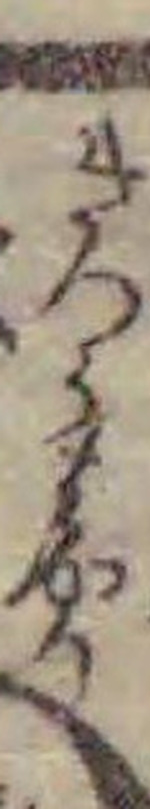きつうはやり
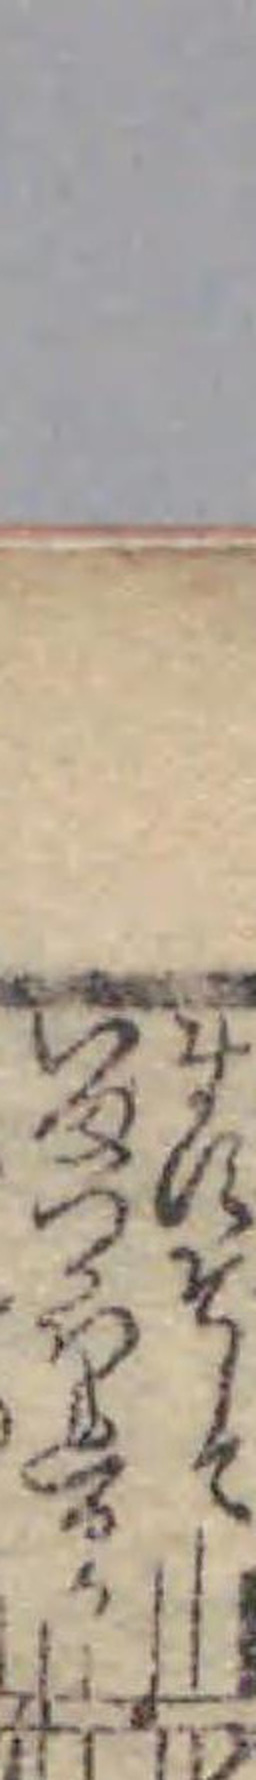いまつかはれるか
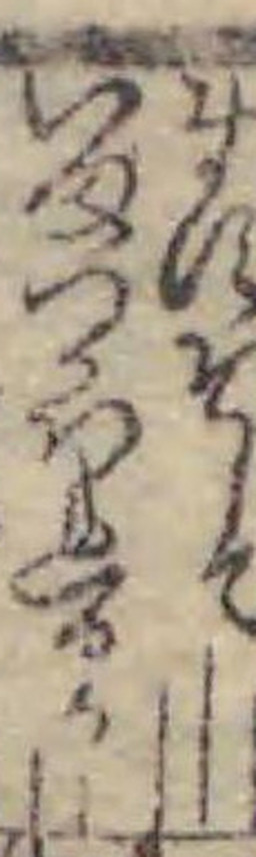いまつかはれるか
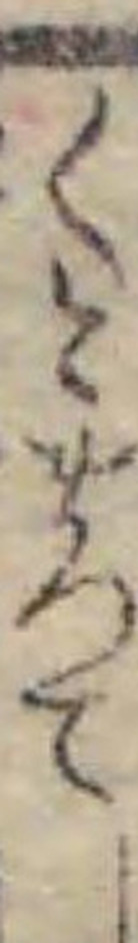〳〵とまつて
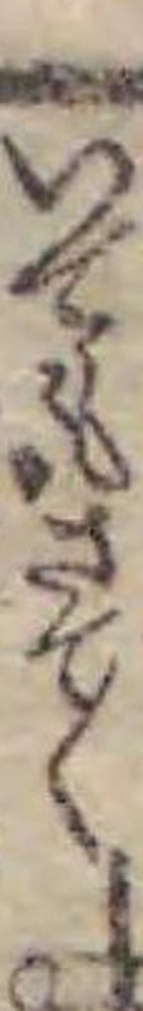いてもさて〳〵
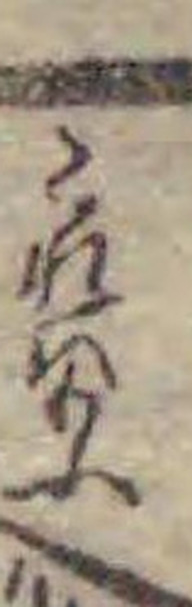これはもふ
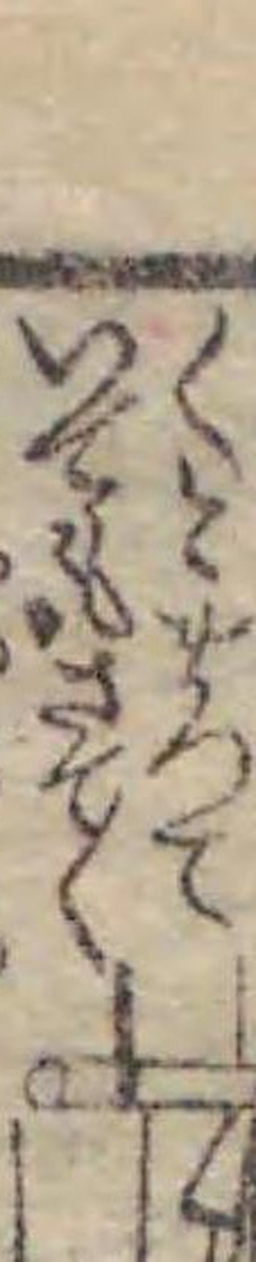いてもさて〳〵
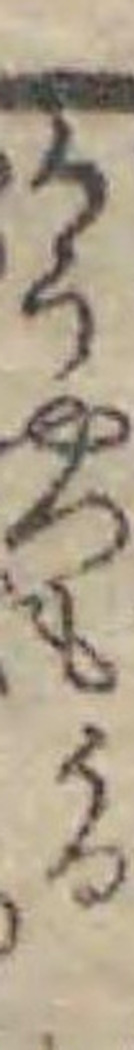かうやつもうる
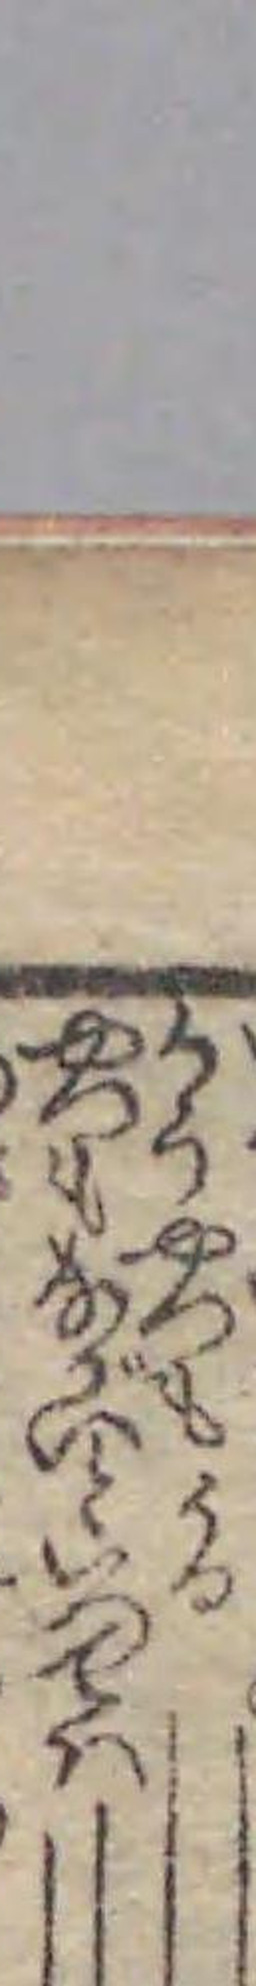やつもながいといつては
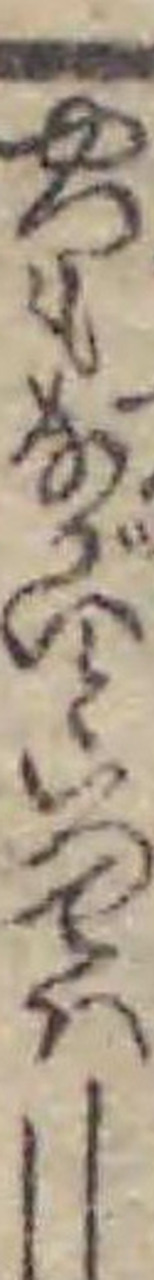やつもながいといつては
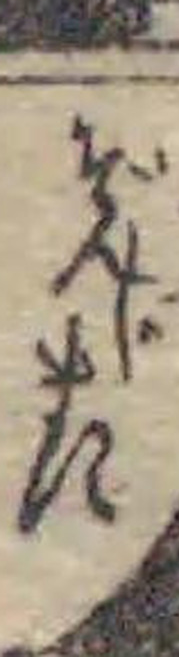ぞんじます
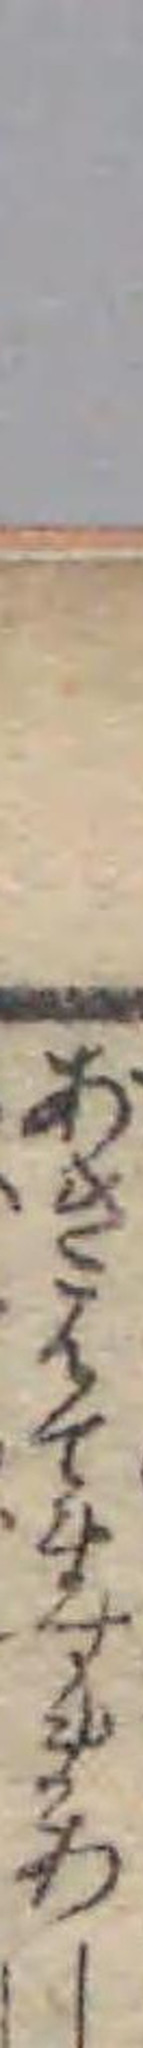あきはてますまあ
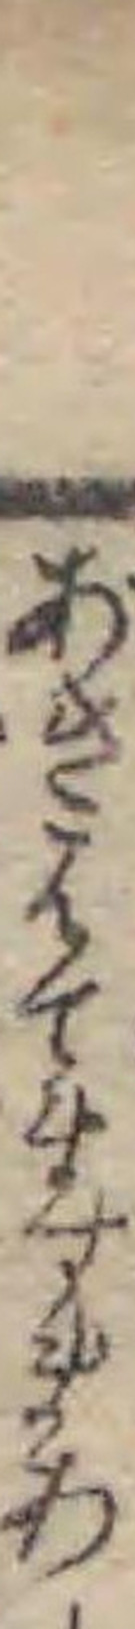あきはてますまあ
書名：紙屑身上噺 : 3巻
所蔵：国立国会図書館 National Diet Library, JAPAN
